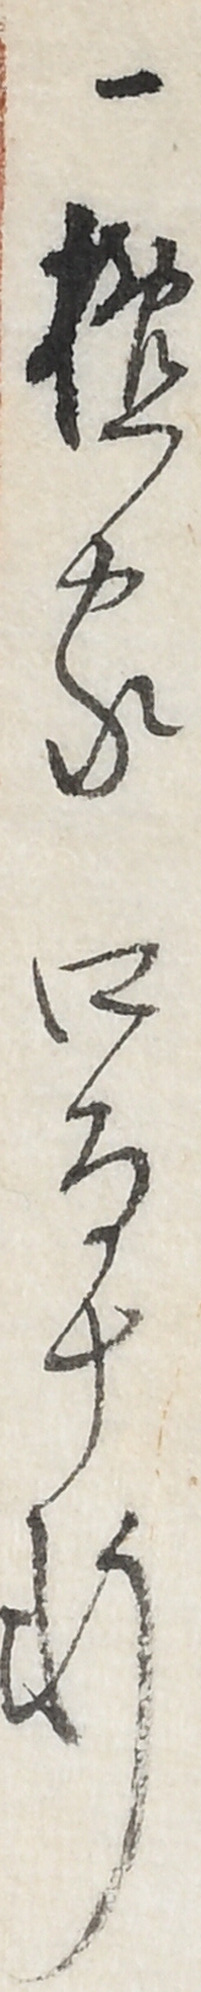一檀家四百十軒
